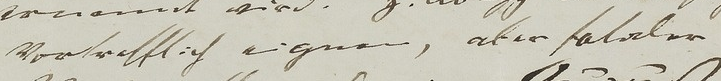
vortrefflich eignen, aber fataler
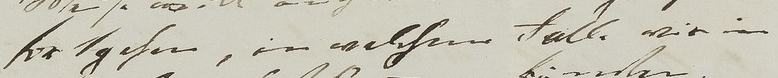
fortgehen, in welchem Falle wir in
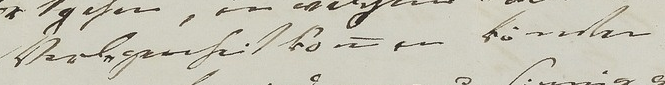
Verlegenheit kommen könnten.
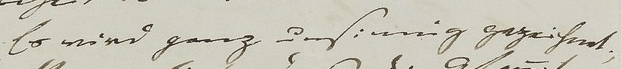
Es wird ganz unsinnig gezeichnet;
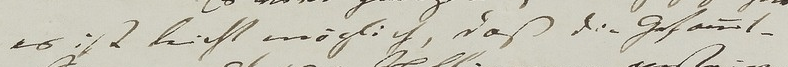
es ist leicht möglich, daß die Gesammt-
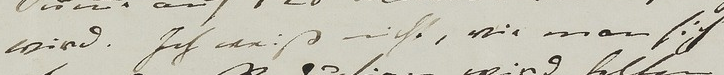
wird. Ich weiß nicht, wie man sich
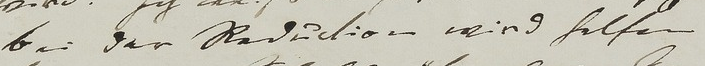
bei der Reduction wird helfen
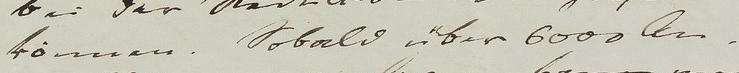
können. Sobald über 6000 An-
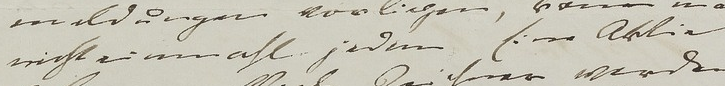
nicht einmahl jedem Eine Aktie
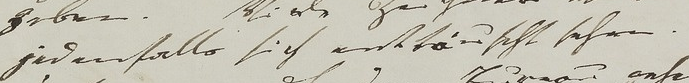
jedenfalls sich enttäuscht sehen.
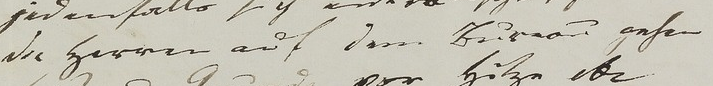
Die Herren auf dem Bureau gehen
